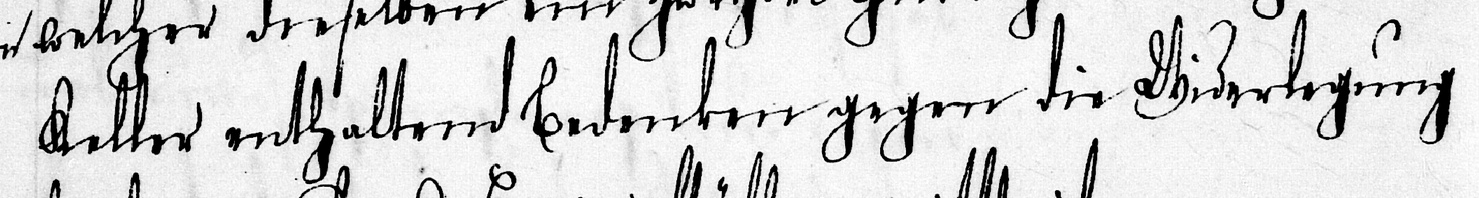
Keller enthaltend Bedenken gegen die Widerlegung
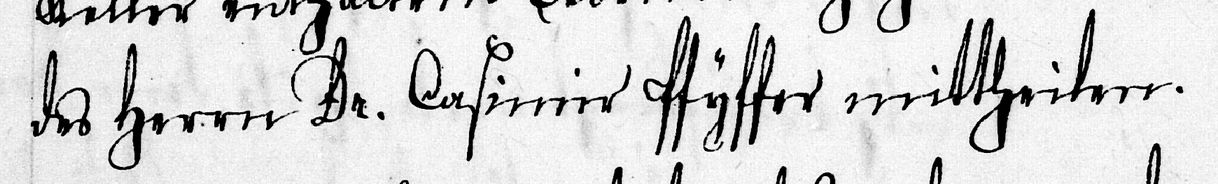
des Herrn Dr. Casimir Pfyffer mittheilen.
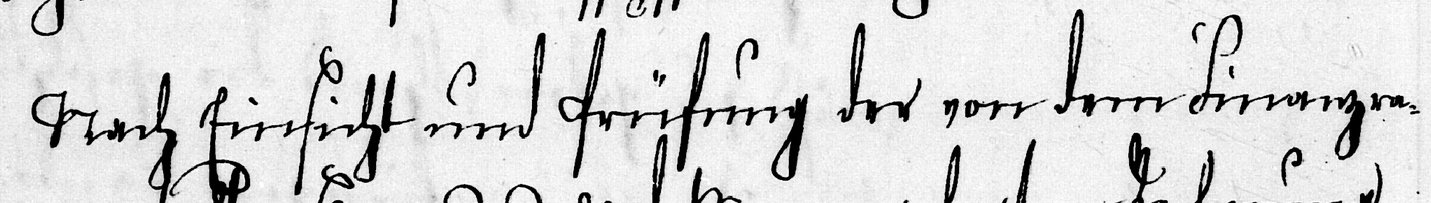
Nach Einsicht und Prüfung der von dem Finanzra¬
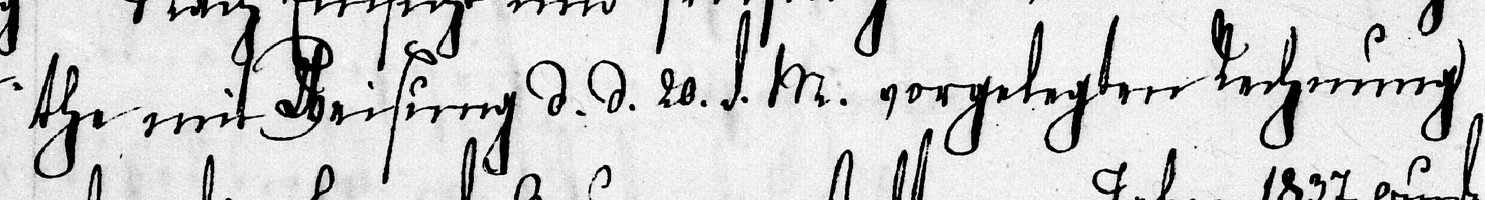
the mit Weisung d. d. 20. d. M. vorgelegten Rechnung
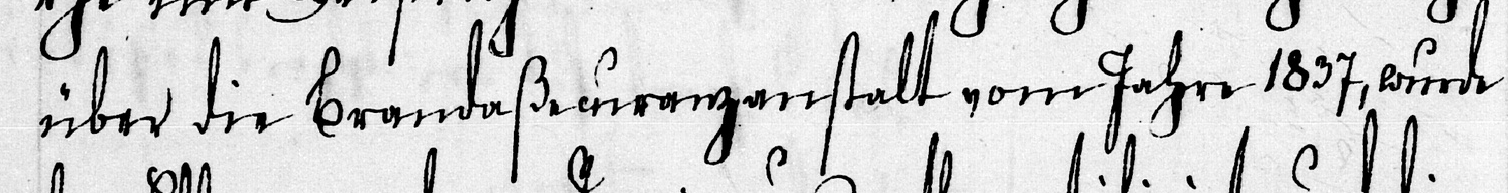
über die Brandaßecuranzanstalt vom Jahre 1837., wurde
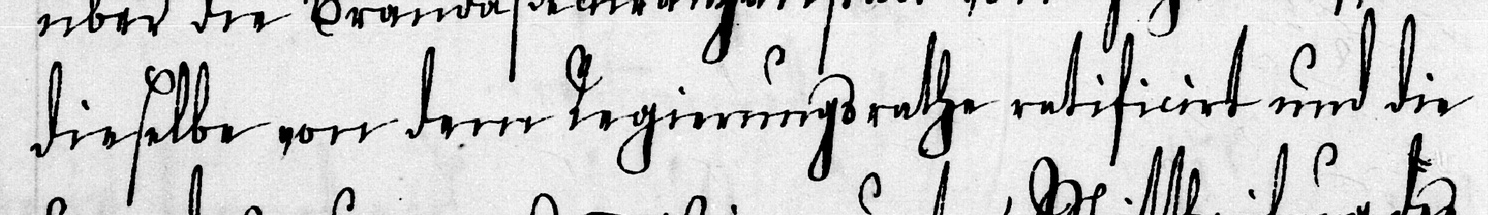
dieselbe von dem Regierungsrathe ratificirt und die
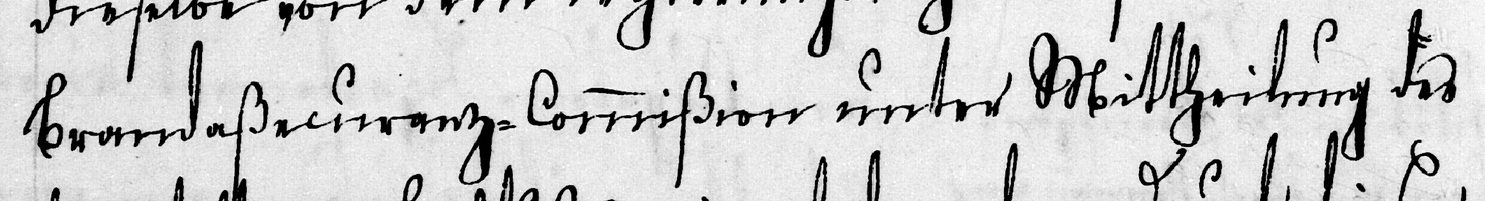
Brandaßecuranz-Commißion unter Mittheilung des
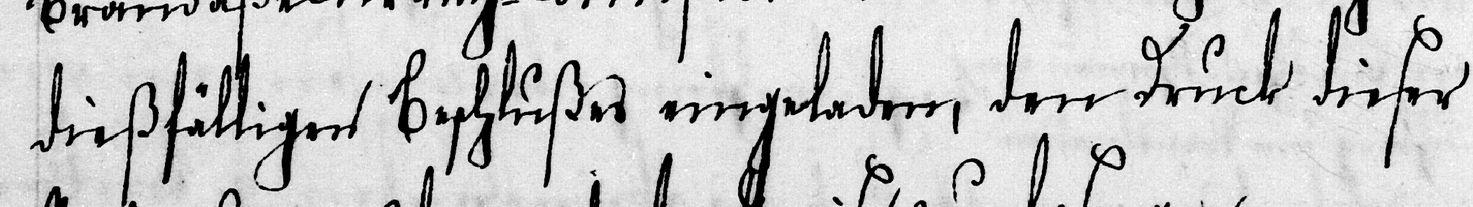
dießfälligen Beschlußes eingeladen, den Druck dieser
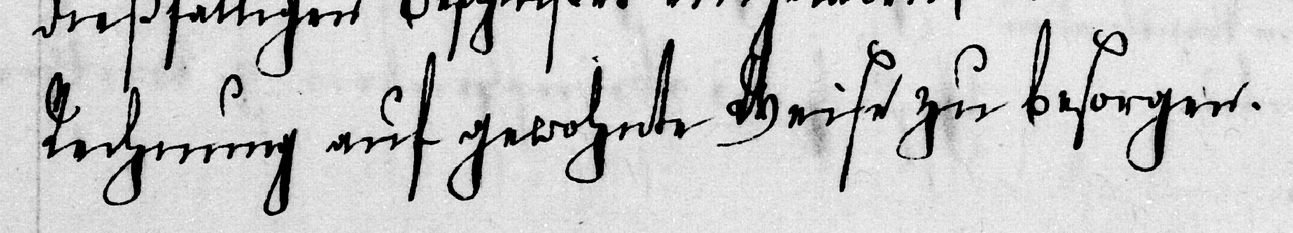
Rechnung auf gewohnte Weise zu besorgen.
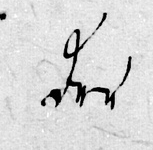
er
